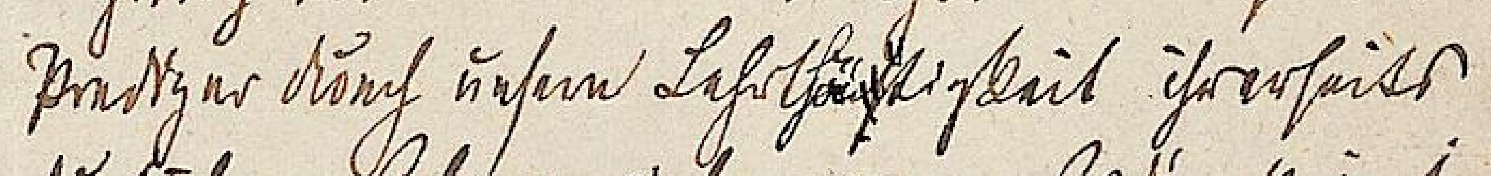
Prediger durch unsere Lehrthätigkeit ihrerseits
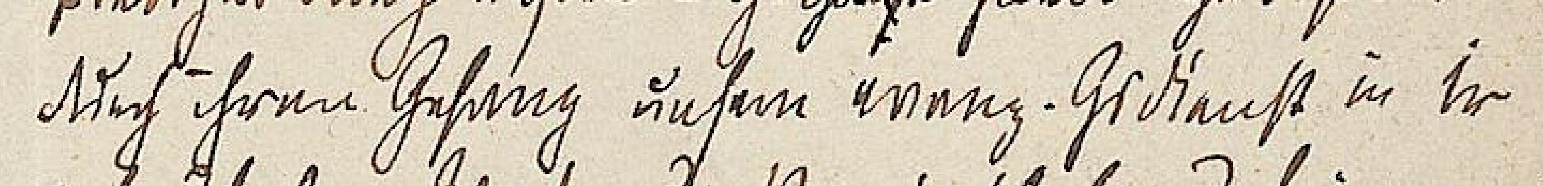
durch ihren Gesang unsern evang. Gsdienst in 1r
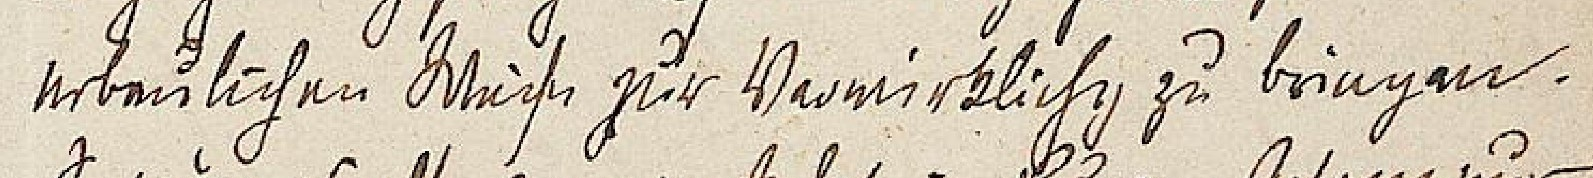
erbaulichen Weise zur Verwirklichg zu bringen.
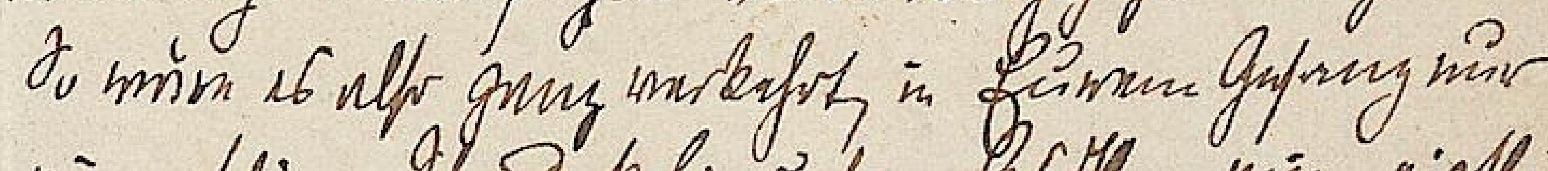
So wäre es also ganz verkehrt, in Eurem Gesang nur
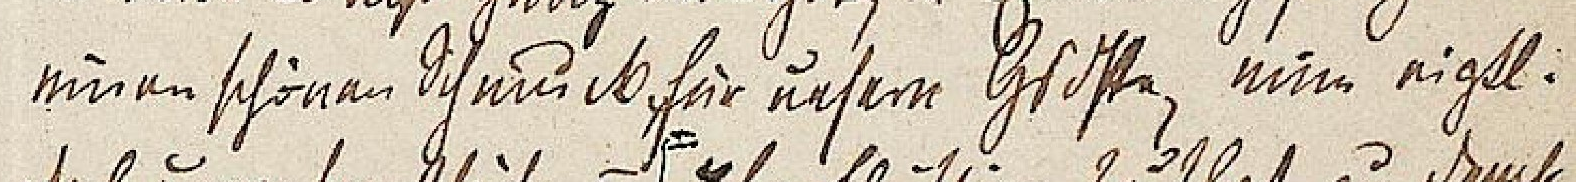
einen schönen Schmuck für unsere Gsdst, eine eigtl.
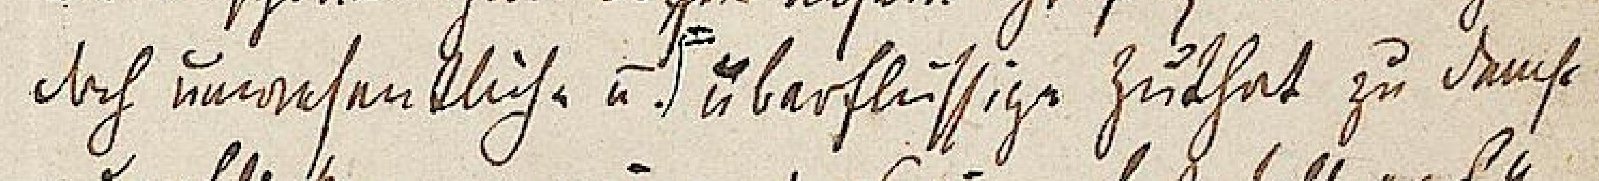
doch unwesentliche u. [ überflüssige Zuthat zu dems.
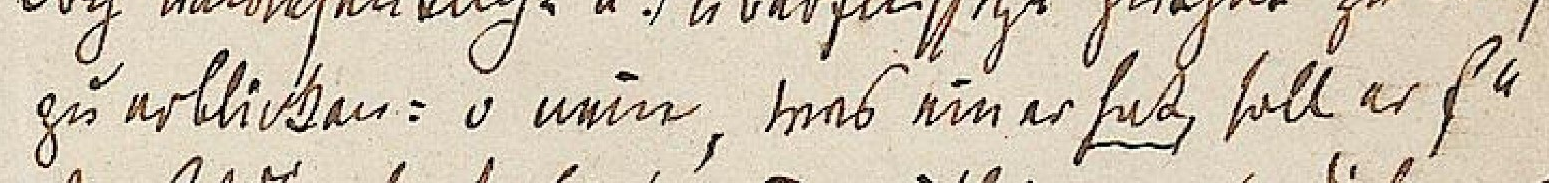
zu erblicken: o nein, was einer hat, soll er f"
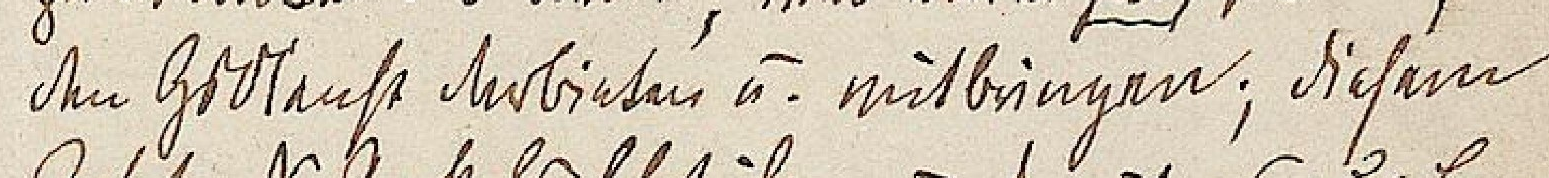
den Gsdienst darbieten u. mitbringen; diesem
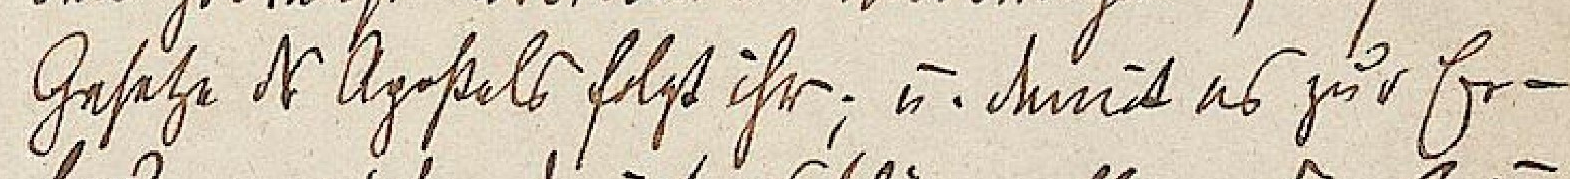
Gesetze des Apostels folgt ihr; u. damit es zur Er¬
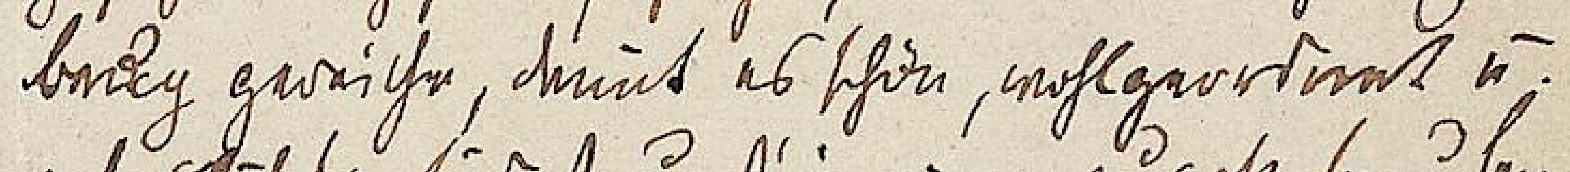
bauung gereiche, damit es schön, wohlgeordnet u.
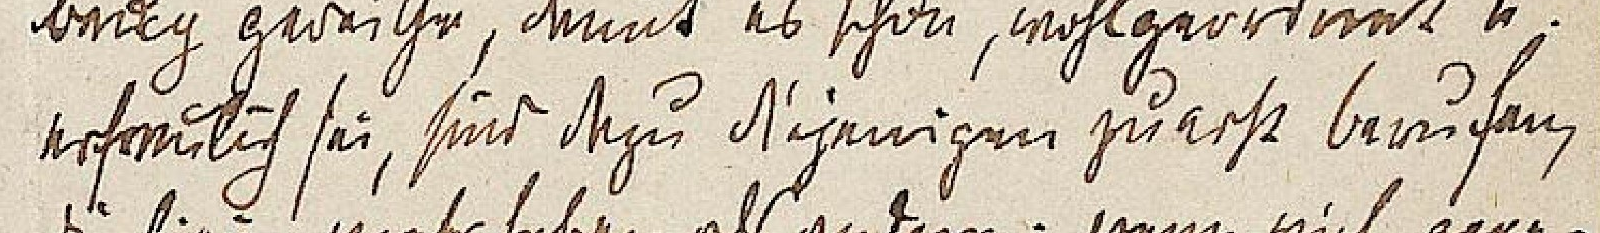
erfreulich sei, sind dazu diejenigen zuerst berufen,
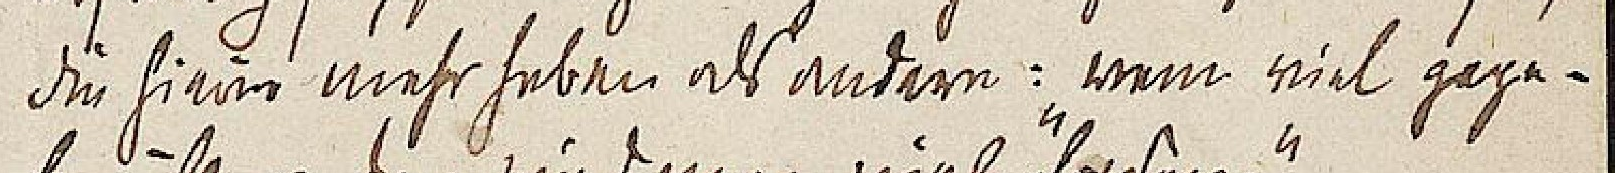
die hiervon mehr haben als anderen: wem viel gege¬
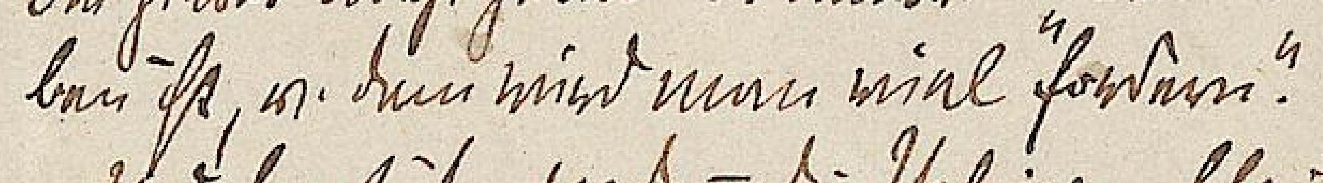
bei ist, v. dem wird man viel "fordern."
